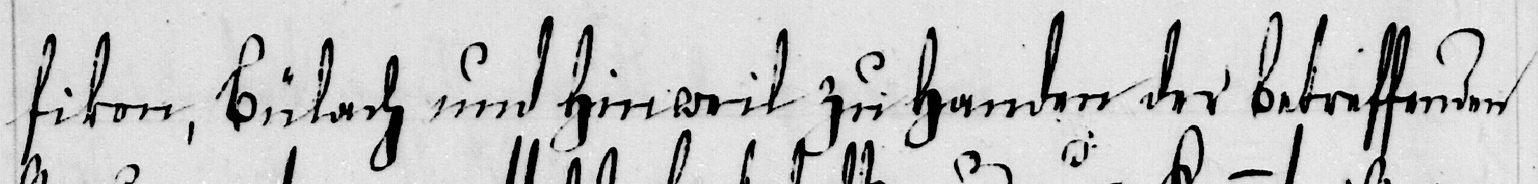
fikon, Bülach und Hinweil zu Handen der betreffenden
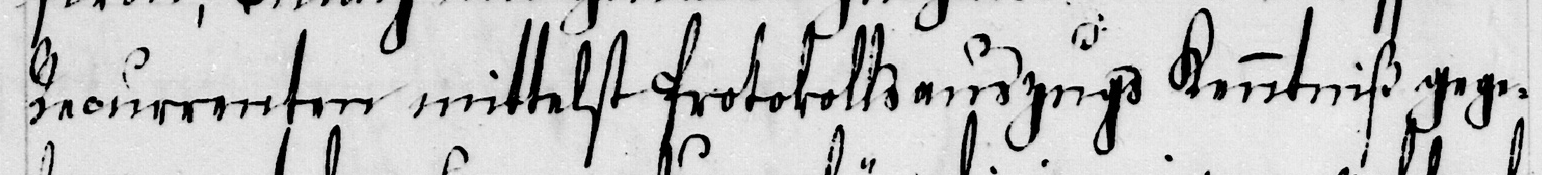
Recurrenten mittelst Protokollsauszugs Kenntniß gege¬
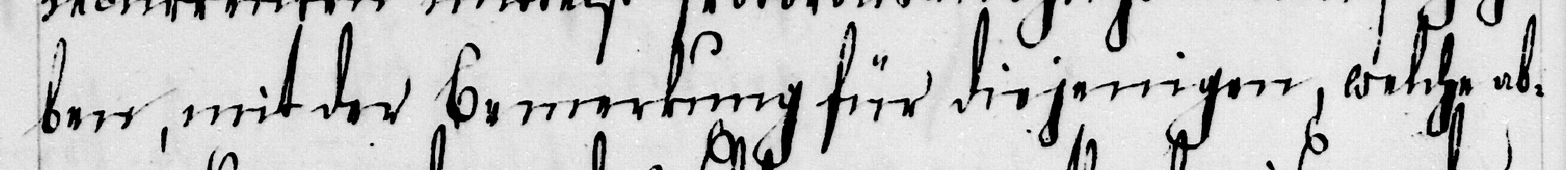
ben, mit der Bemerkung für diejenigen, welche ab¬
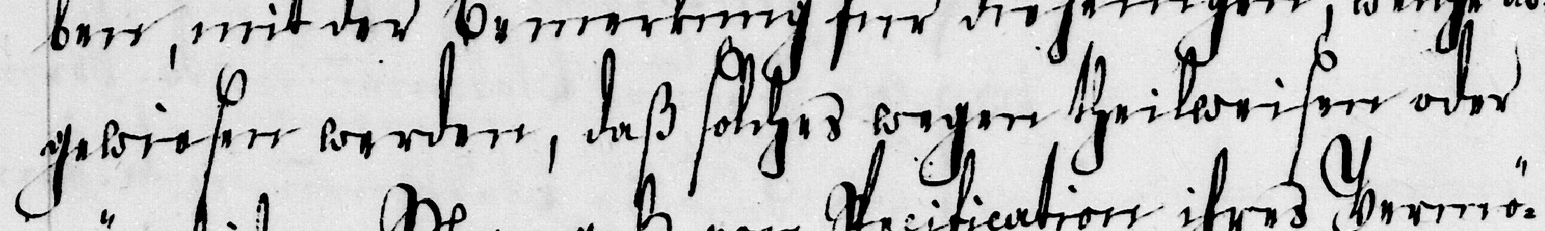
gewiesen werden, daß solches wegen theilweisen oder
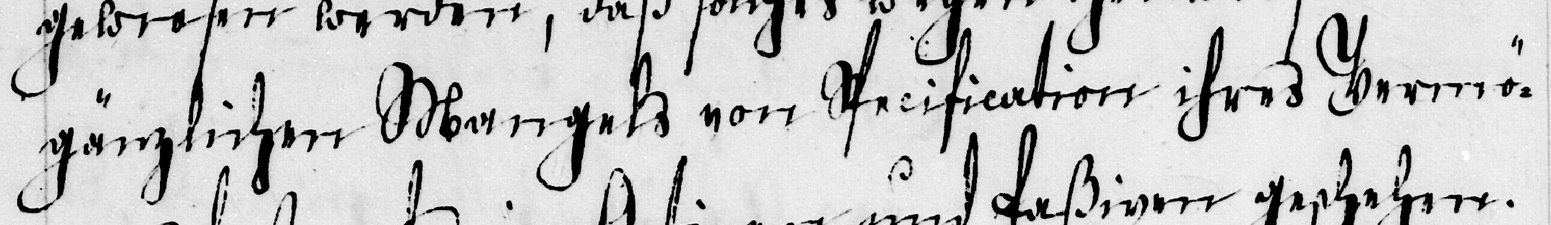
gänzlichen Mangels von Specification ihres Vermö¬
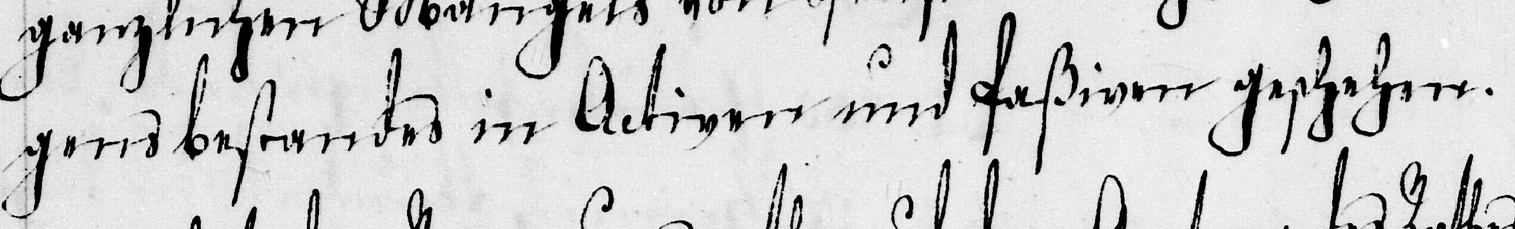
gensbestandes in Activen und Paßiven geschehen.
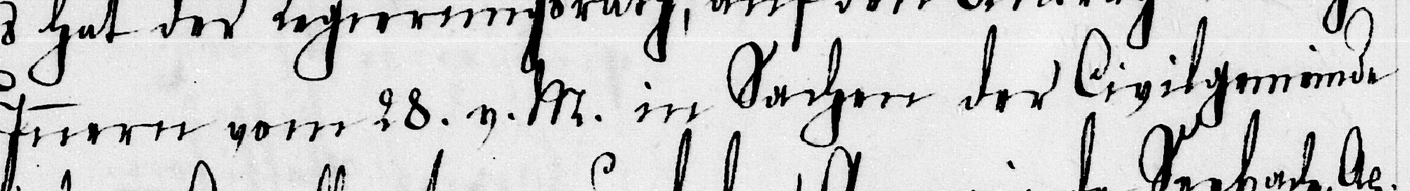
Innern vom 28. v. M. in Sachen der Civilgemeinde
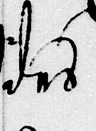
ei¬
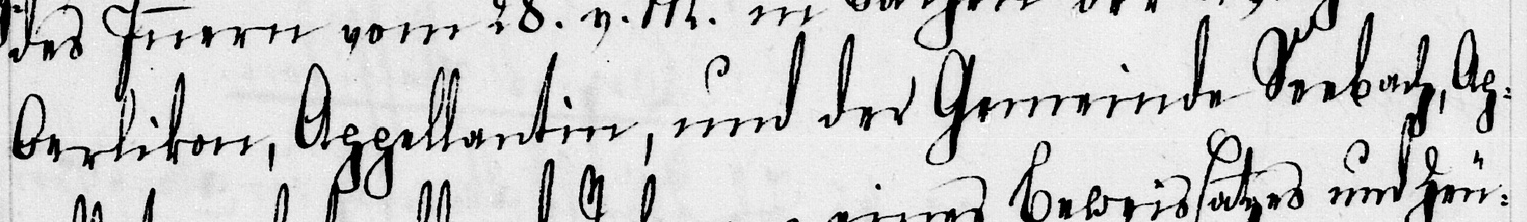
Oerlikon, Appellantin, und der Gemeinde Seebach, A¬
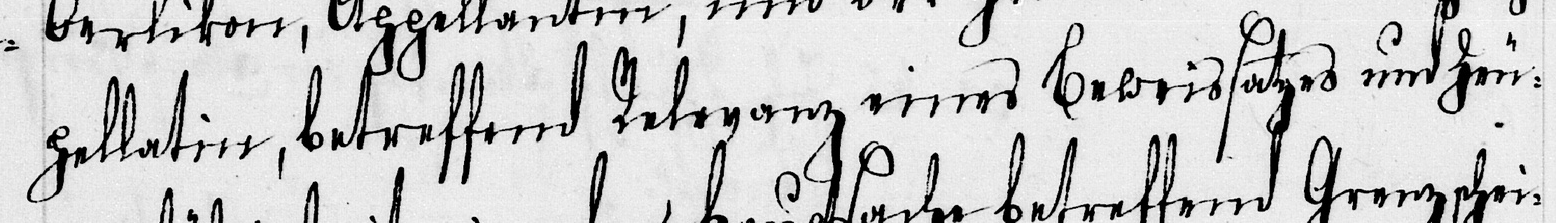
pellatin, betreffend Relevanz eines Beweissatzes und Zeu¬
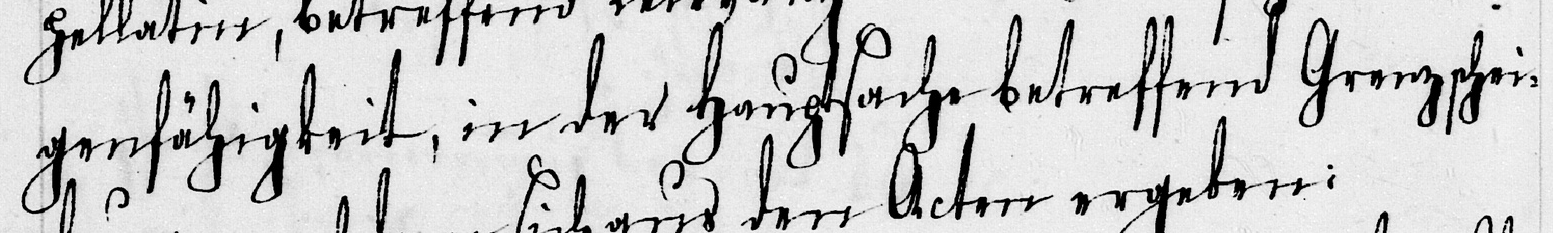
genfähigkeit, in der Hauptsache betreffend Grenzsch¬
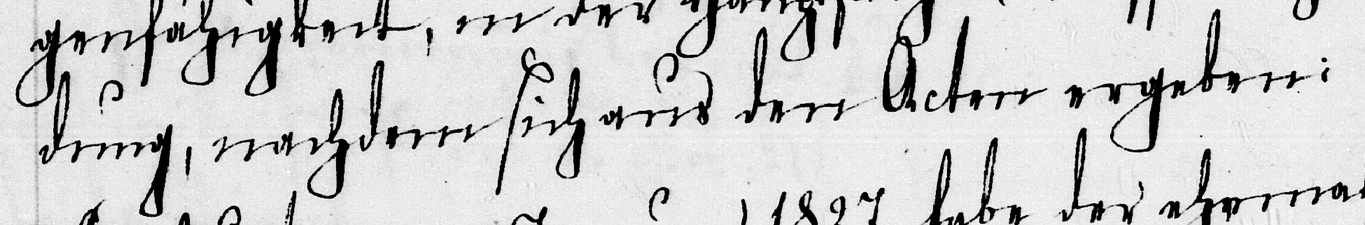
dung, nachdem sich aus den Acten ergeben:
